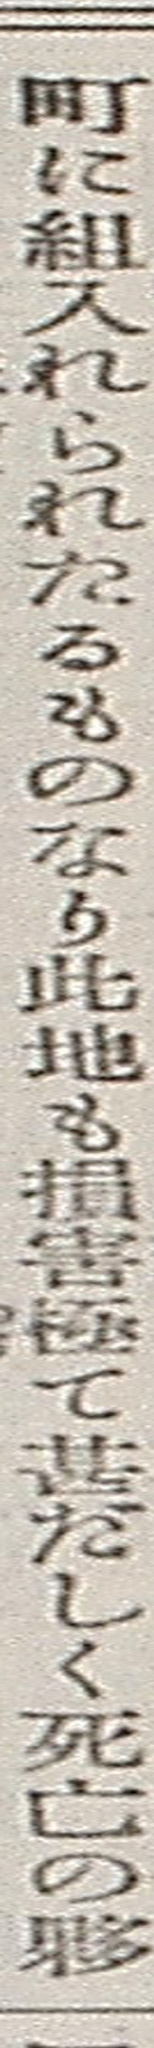町に組入れられたるものなり此地も損害極て甚だしく死亡の夥
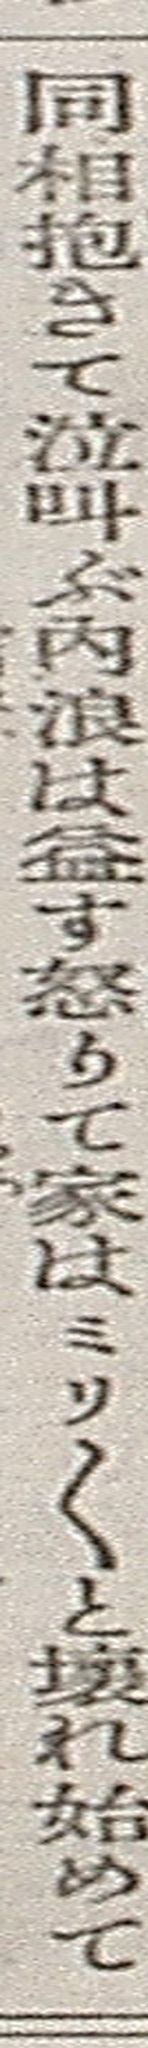同相抱きて泣叫ぶ内浪は益す怒りて家はミリ〳〵と壊れ始めて
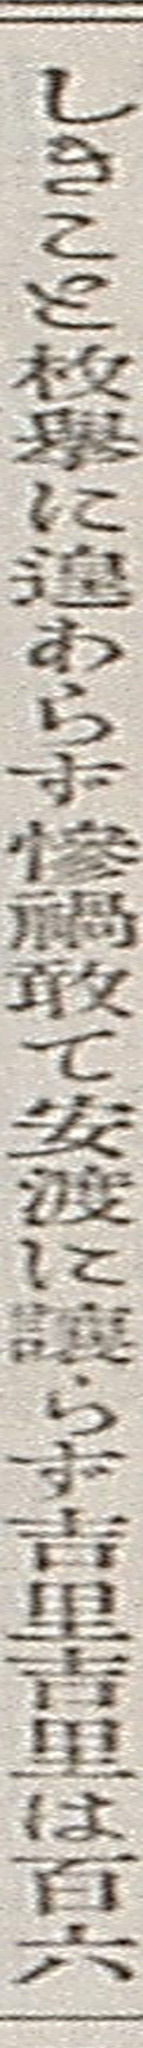しきこと枚挙に遑あらず惨禍敢て安渡に譲らず吉里吉里は百六
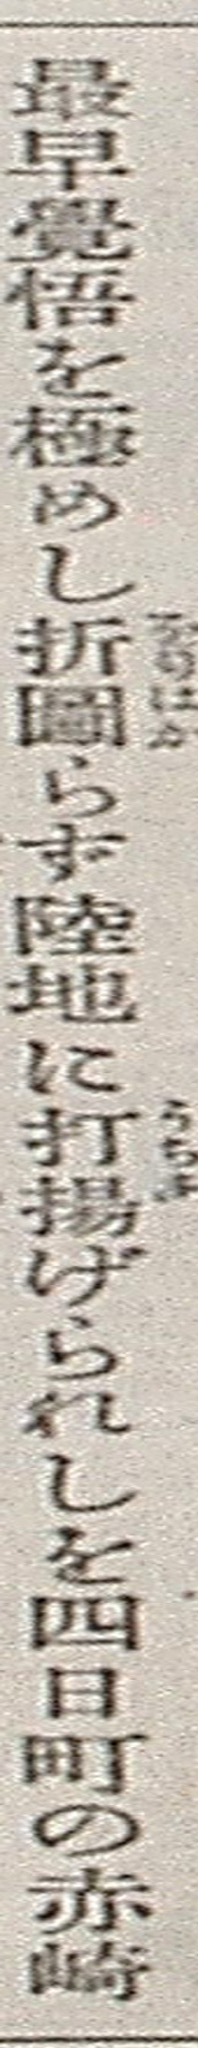最早覚悟を極めし折図らず陸地に打揚げられしを四日町の赤崎
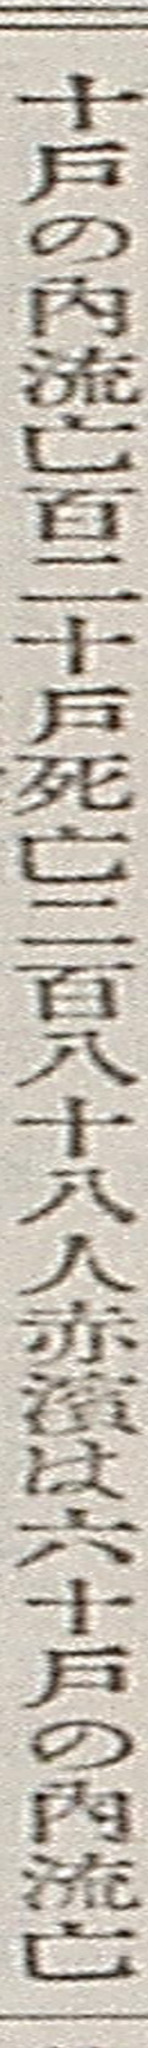十戸の内流亡百二十戸死亡二百八十八人赤浜は六十戸の内流亡
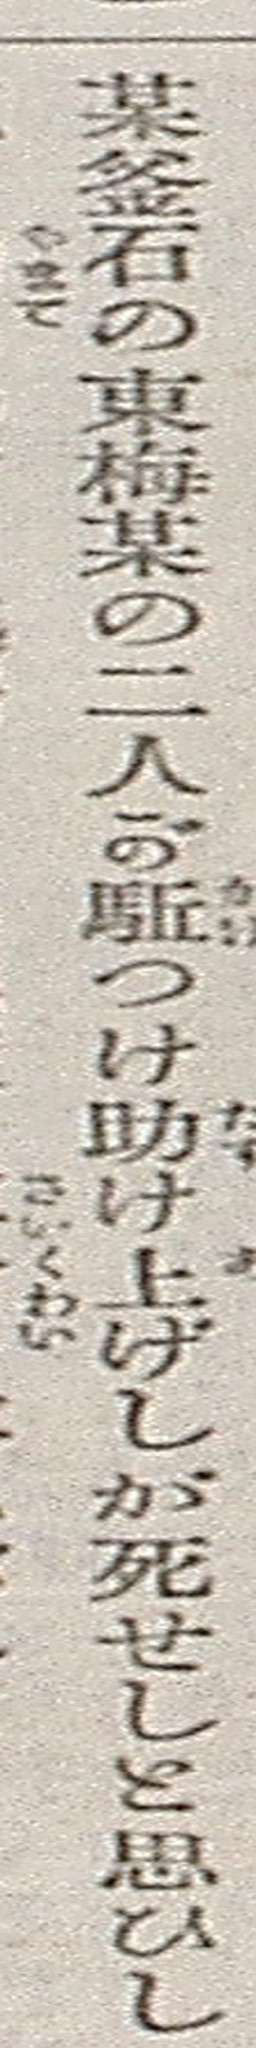某釜石の東梅某の二人が駈つけ助け上げしが死せしと思ひし一
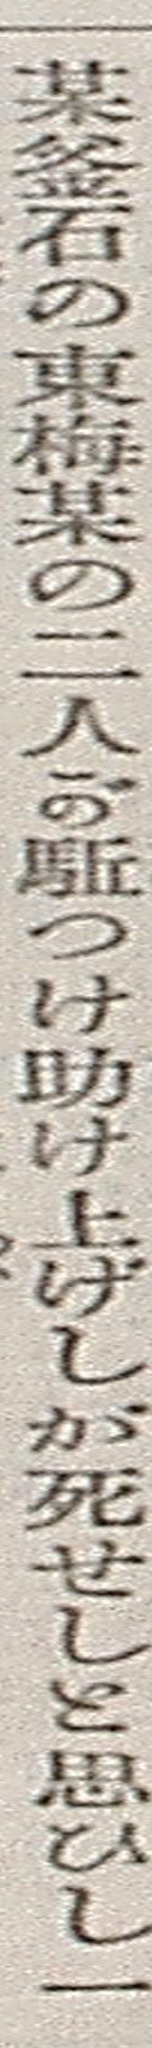某釜石の東梅某の二人が駈つけ助け上げしが死せしと思ひし一
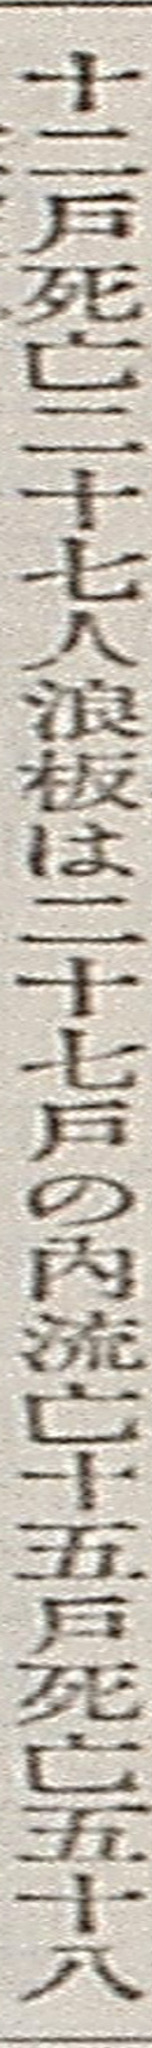十二戸死亡二十七人浪板は二十七戸の内流亡十五戸死亡五十八
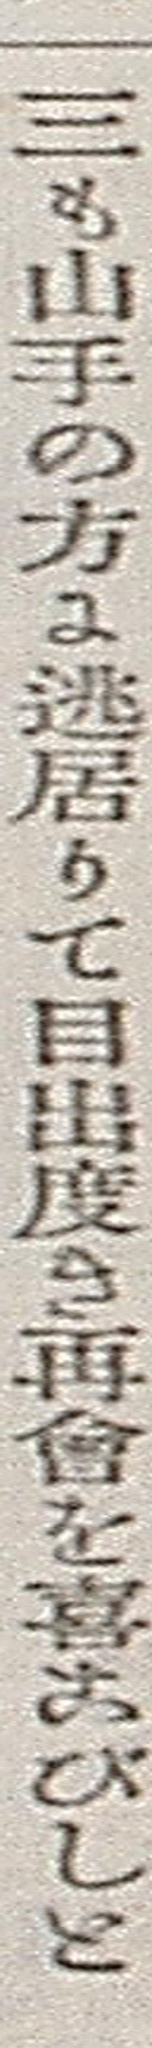三も山手の方に逃居りて目出度き再会を喜こびしと
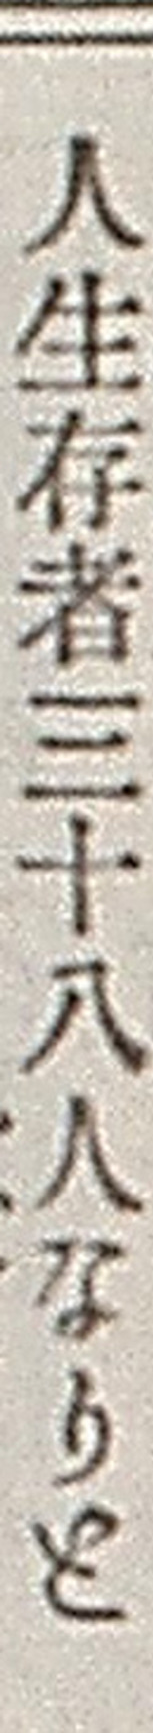人生存者三十八人なりと
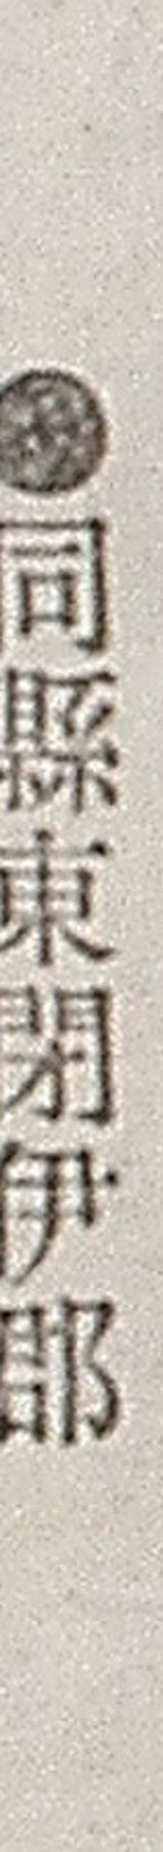●同県東閉伊郡
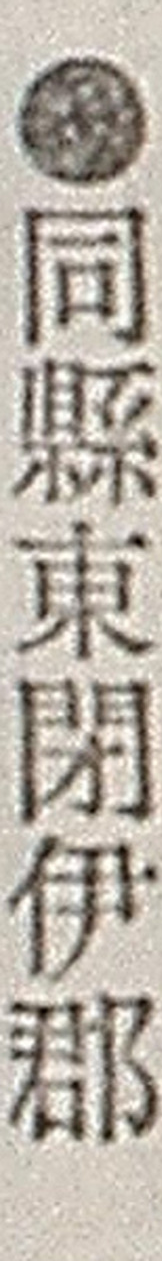●同県東閉伊郡
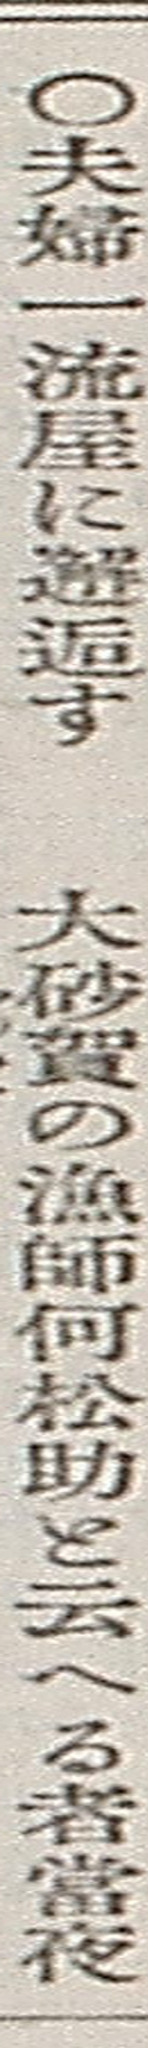○夫婦一流星に邂逅す大砂賀の漁師何松助と云へる者当夜
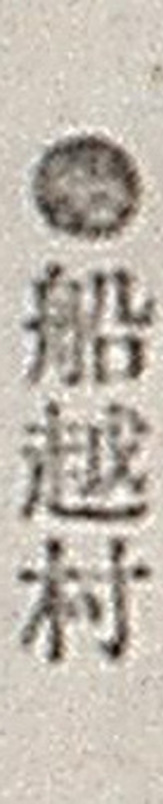●船越村
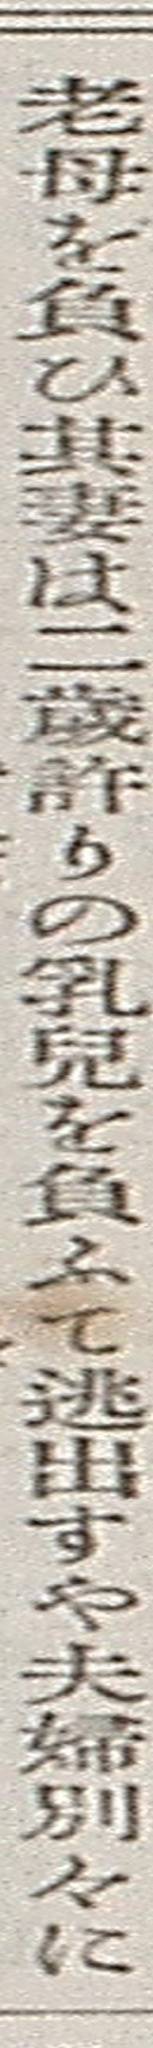老母を負ひ其妻は二歳許りの乳児を負ふて逃出すや夫婦別々に
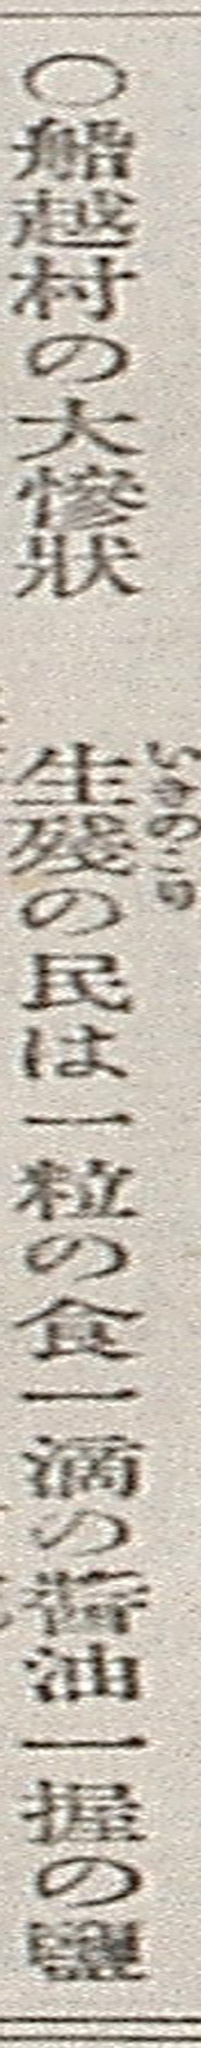○船越村の大惨状生残の民は一粒の食一滴の醤油一握の塩
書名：風俗畫報臨時増刊第百十九號　大海嘯被害録（中）
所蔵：東京大学地震研究所図書室 Earthquake Research Institute Library, The University of Tokyo, JAPAN
